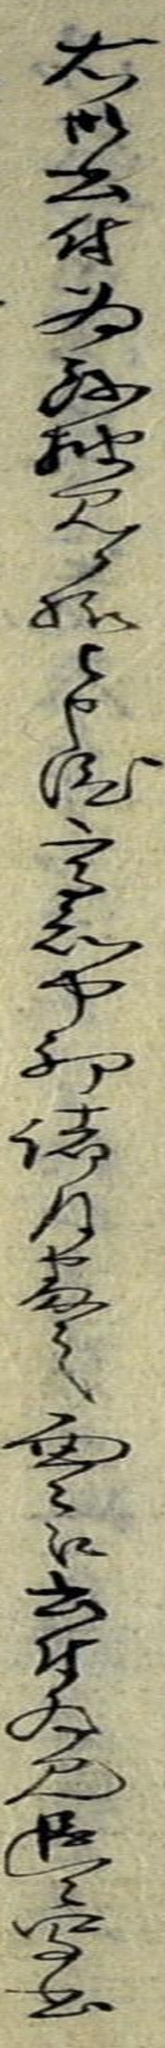右御書付為致披見候様被申渡高知中初諸月番之面々江書付為見追々写書
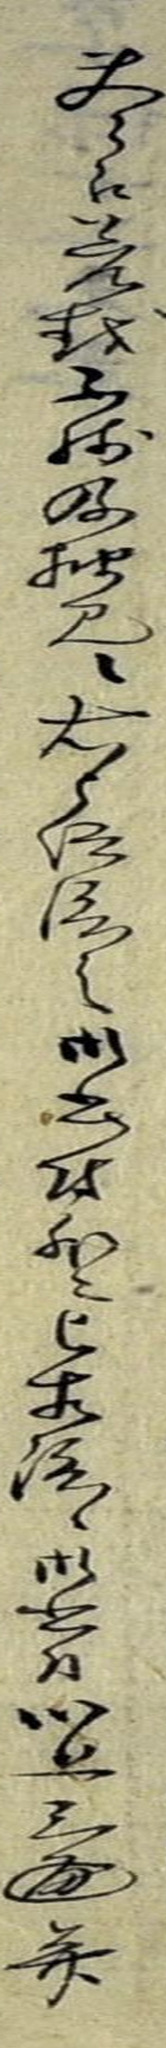夫々江差越不残及披見候右被仰渡之御書付外ニ被相渡候御書付以上三通并
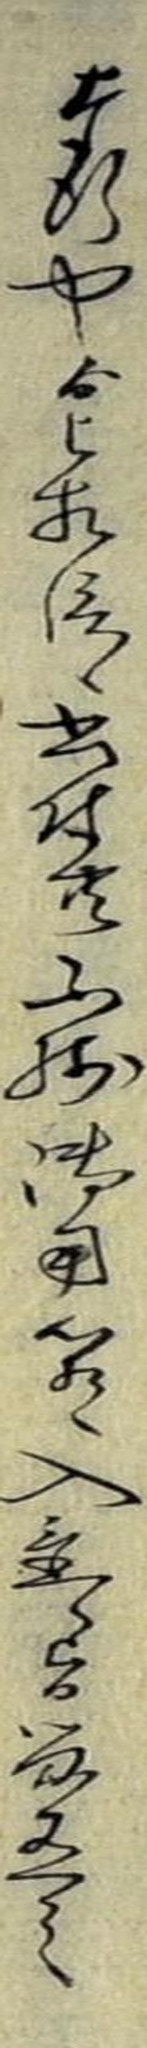奉行中ゟ被相渡候書付共不残御用箱へ入置候旨留有之
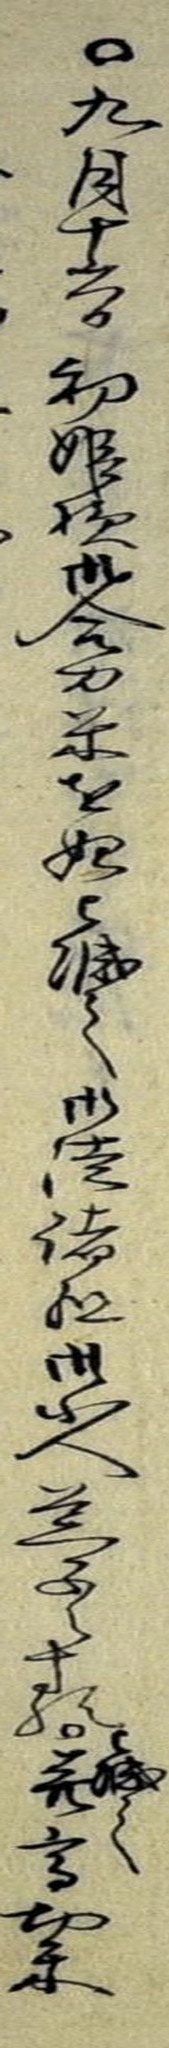〇九月十六日初姫様御合力米を始被減之御徒諸組御小人荒子之類◦被減之并高切米
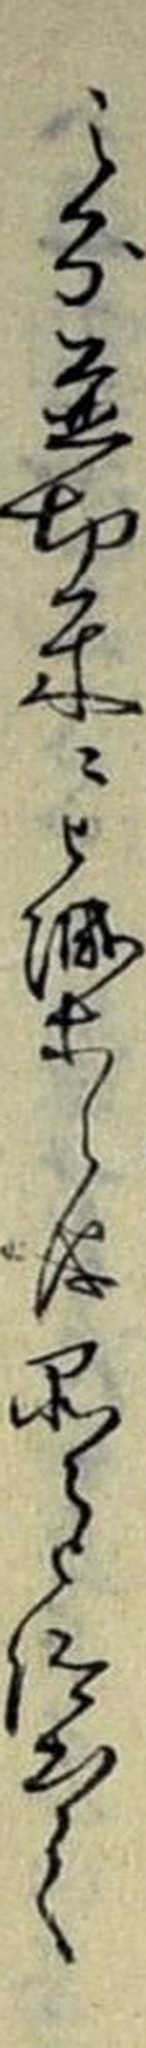之分並切米ニ被減等之儀品々被仰出之
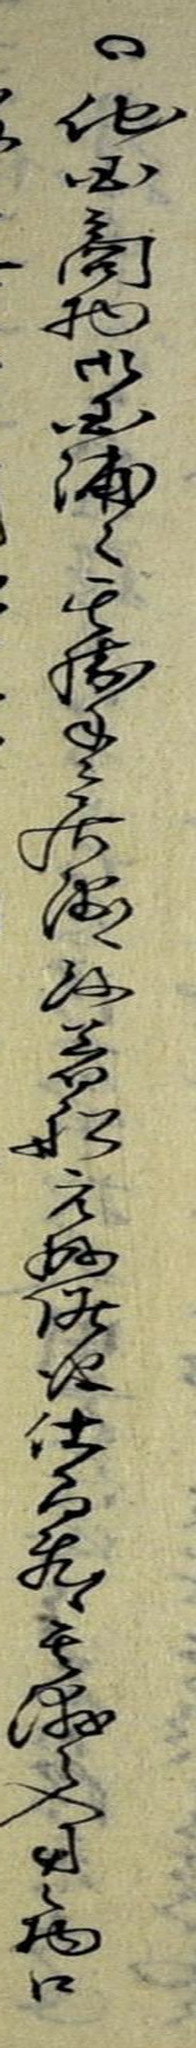〇他国商物御国浦之其勝手ニ居へ致着船取扱候儀仕間敷候其浦之入用之物口
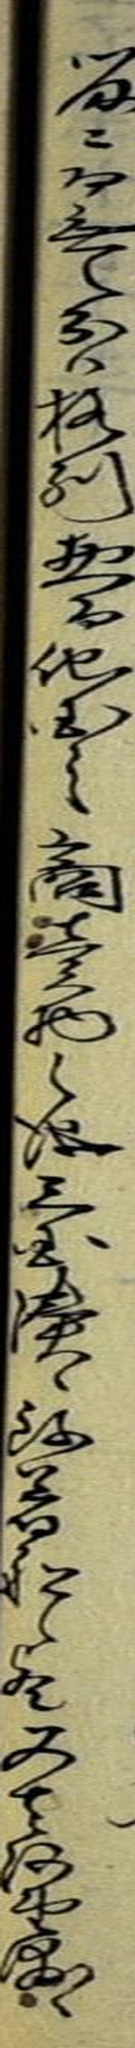留ニ而無之分ハ格別惣而他国之商売物之儀三国湊へ致着船候歟又者河野浦へ
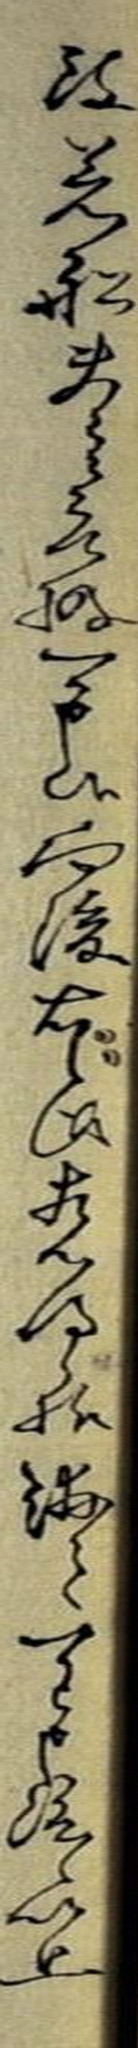致着船夫々ニ取扱可申候向後右之趣相心得候様浦々へ可申渡候以上
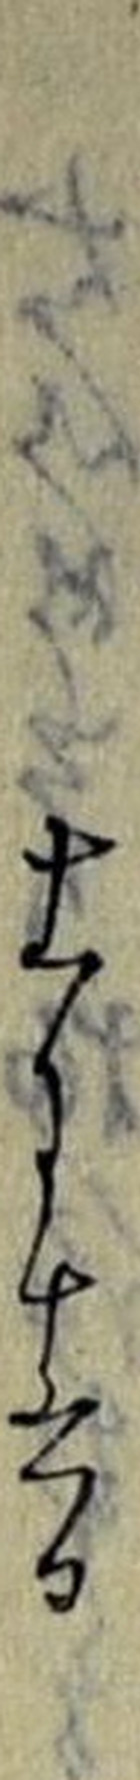十一月十六日
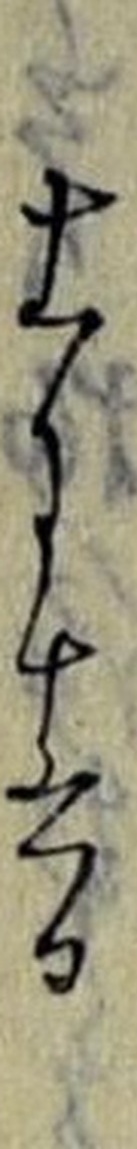十一月十六日
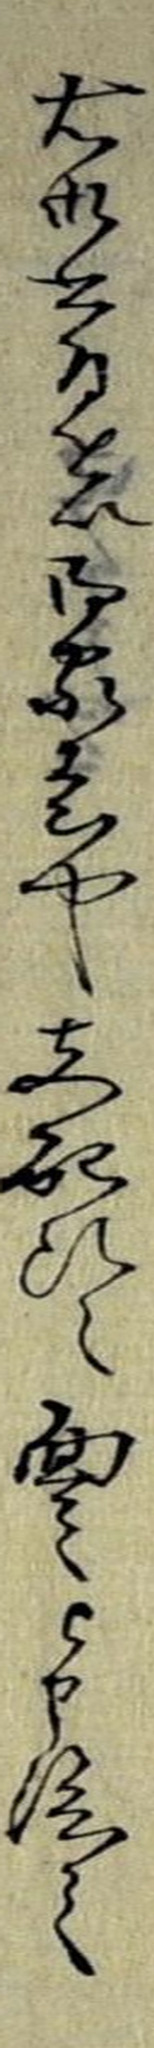右御書付を以御家老中支配頭之面々へ被申渡之

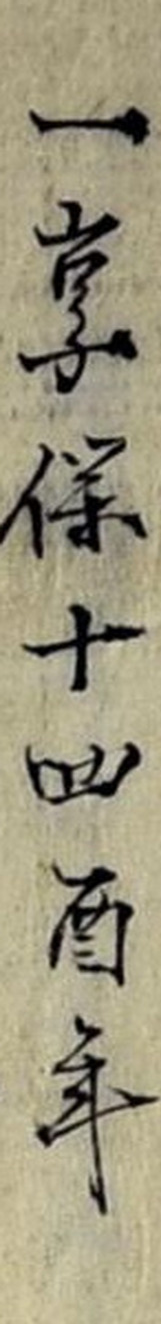一享保十四酉年
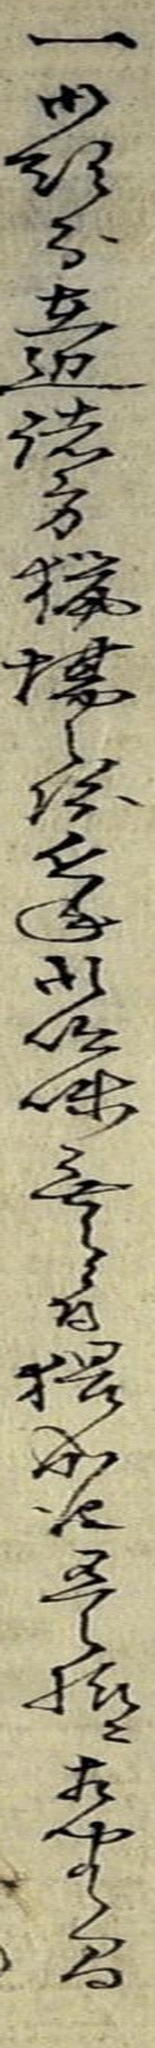一御領分在辺諸方猟場之儀近年御吟味無之ニ付猥成儀有之様ニ相聞候間
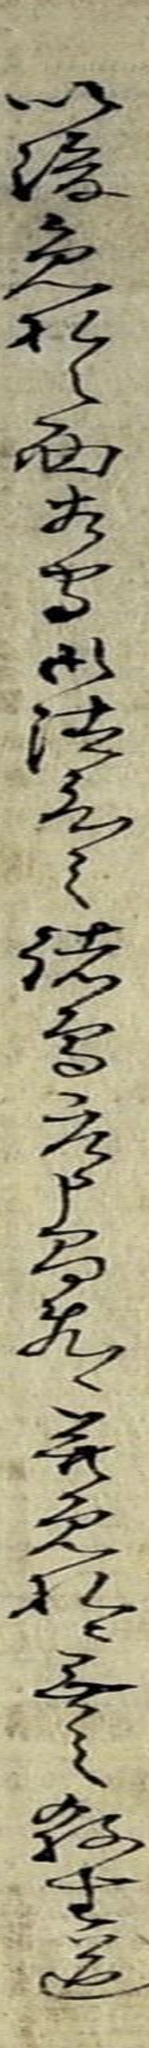以後免札之届相守御法度之諸鳥取申間敷候并面札ニ無之殺生道
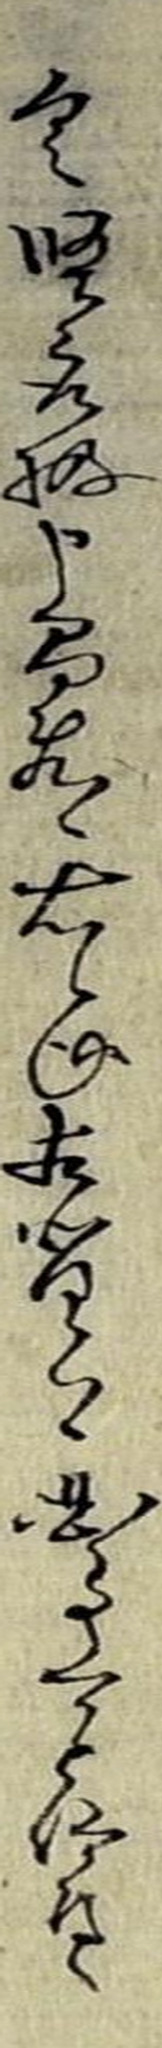具堅取扱申間敷候右之趣相背候ハヽ曲事可被仰付候
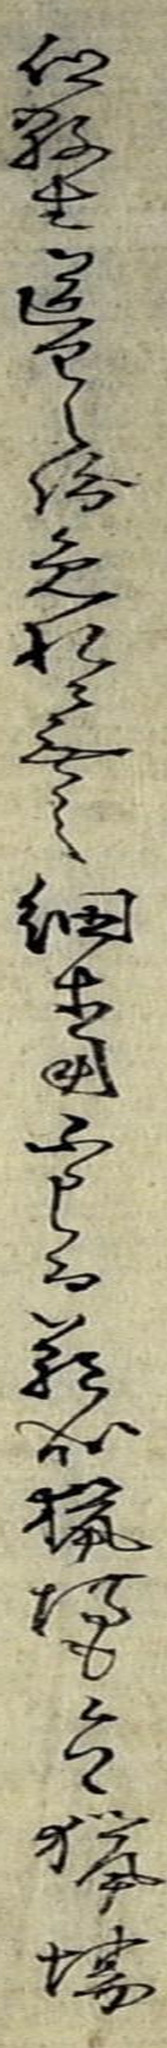但殺生道具之儀免札ニ無之網等用不申候而難成猟場も候ハヽ猟場
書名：命令之部 一
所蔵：福井県文書館 Fukui Prefectural Archives
